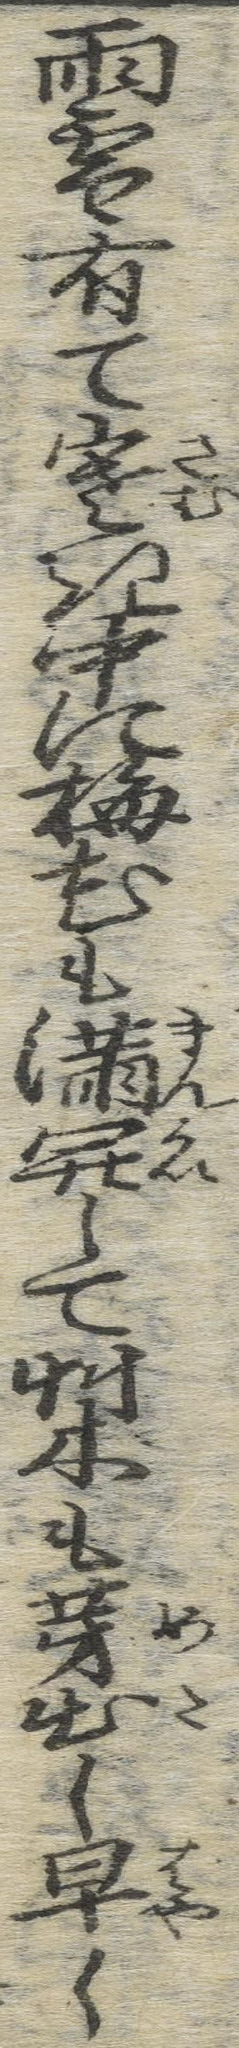雨雲有て寒き中に梅花も満開して艸木も芽出し早く
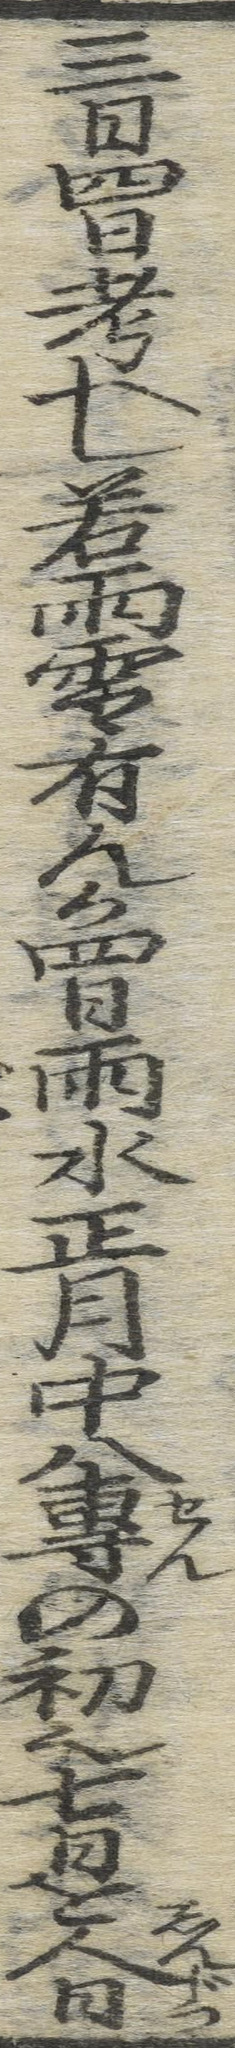三日四日考へし若雨雪有んか四日雨水正月中八専の初也七日を人日
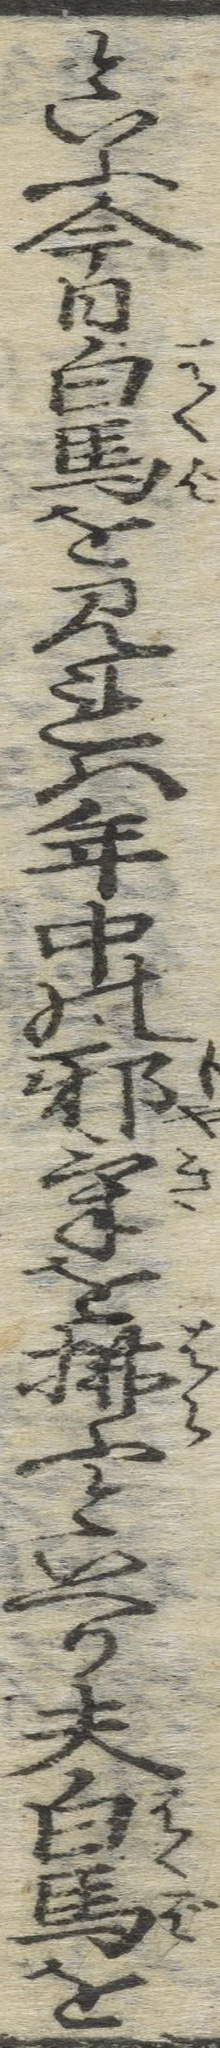といふ今日白馬を見れは年中の邪気を排ふといへり夫白馬を
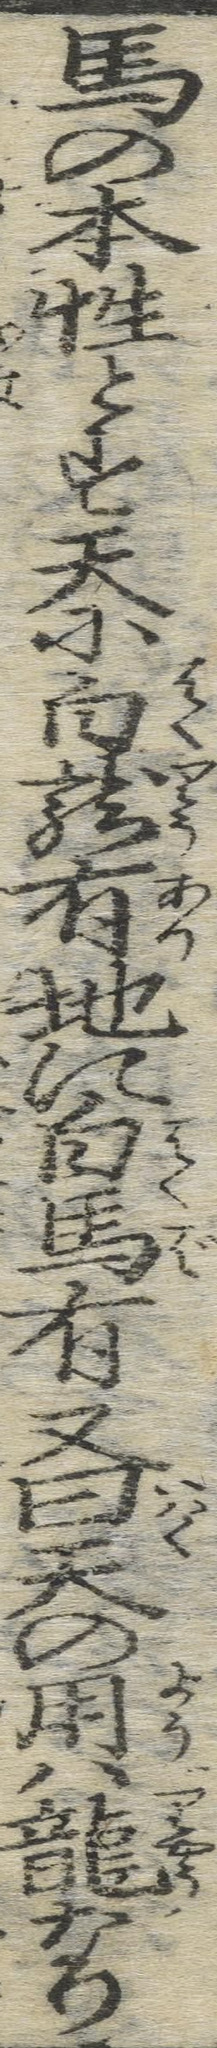馬の本性とす天に白龍有地に白馬有又曰天の用は龍なり
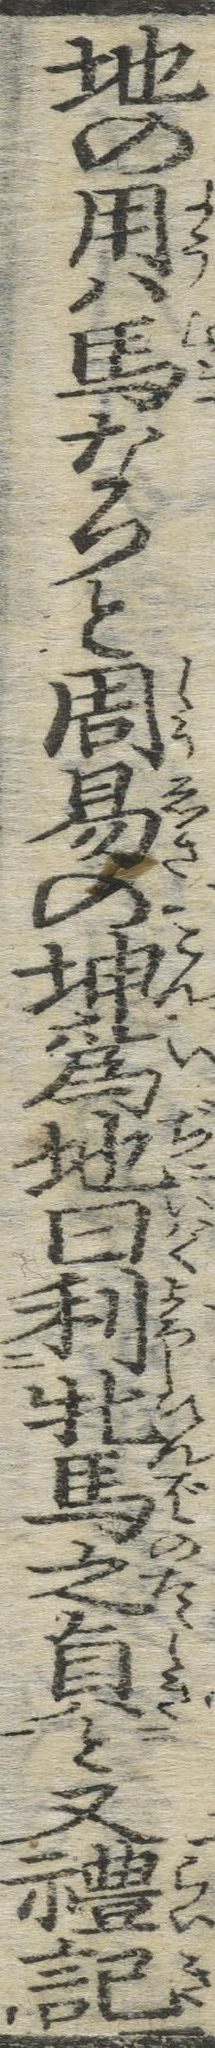地の用は馬なりと周易の坤為地曰利牝馬之貞二と又禮記
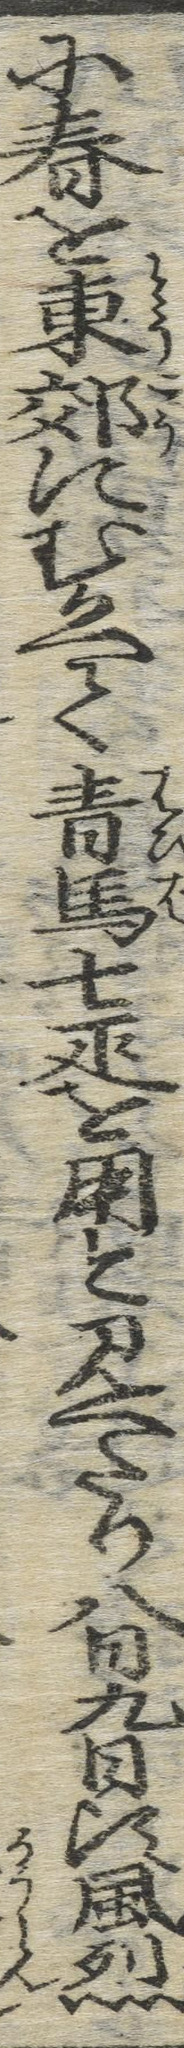に春を東郊にむかへて青馬七疋を用と見へたり八日九日冷風烈
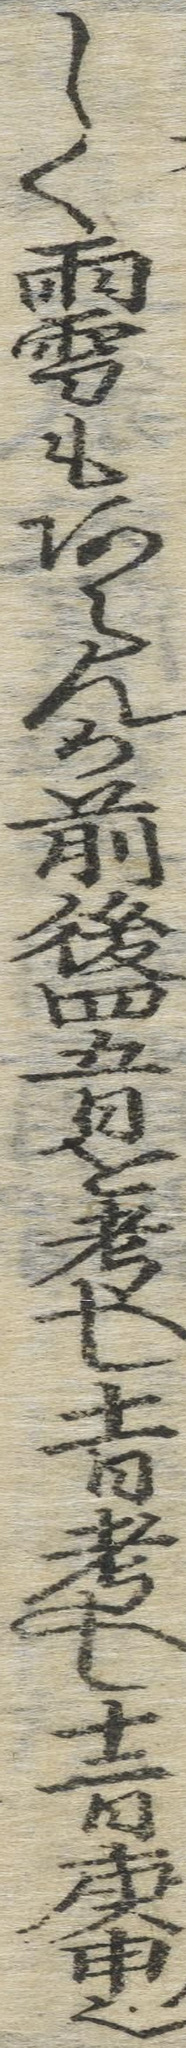しく雨雪もあらんか前後四五日を考へし十一日考へし十二日庚申也
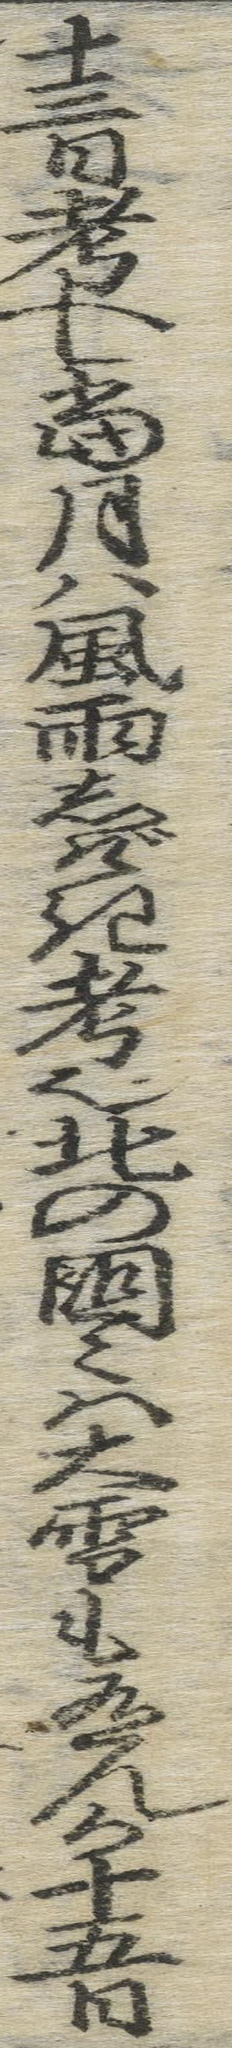十三日考へし当月は風雨しげき考也北の国〻は大雪も有んか十五日
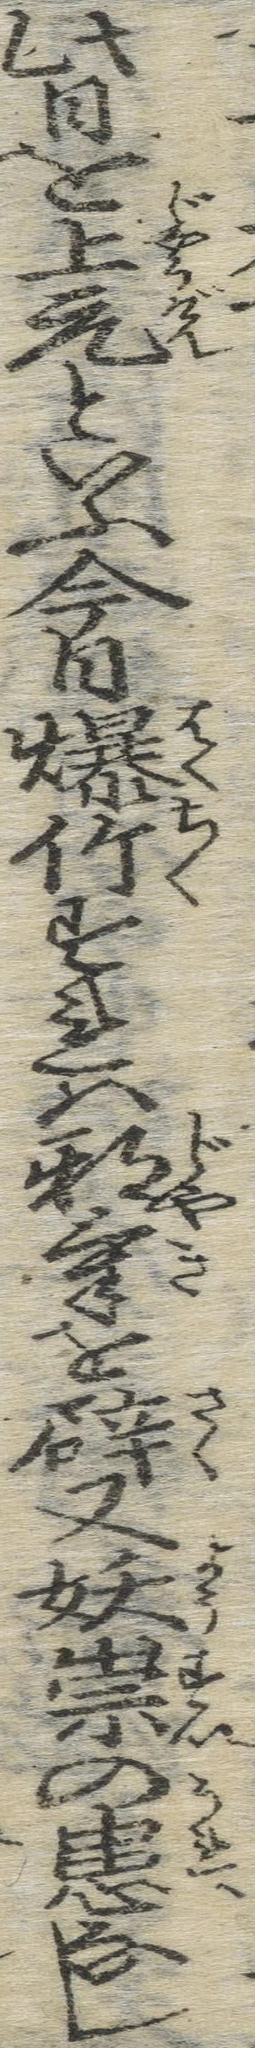此日を上元といふ今日爆竹すれは邪気を辟又妖崇の患なし
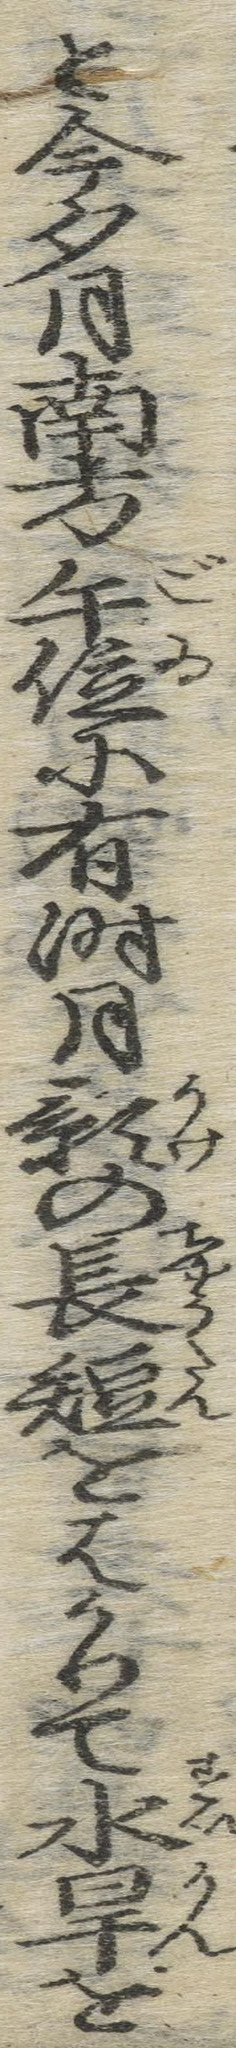と今夕月南方午位に有時月影の長短をはかりて水旱を
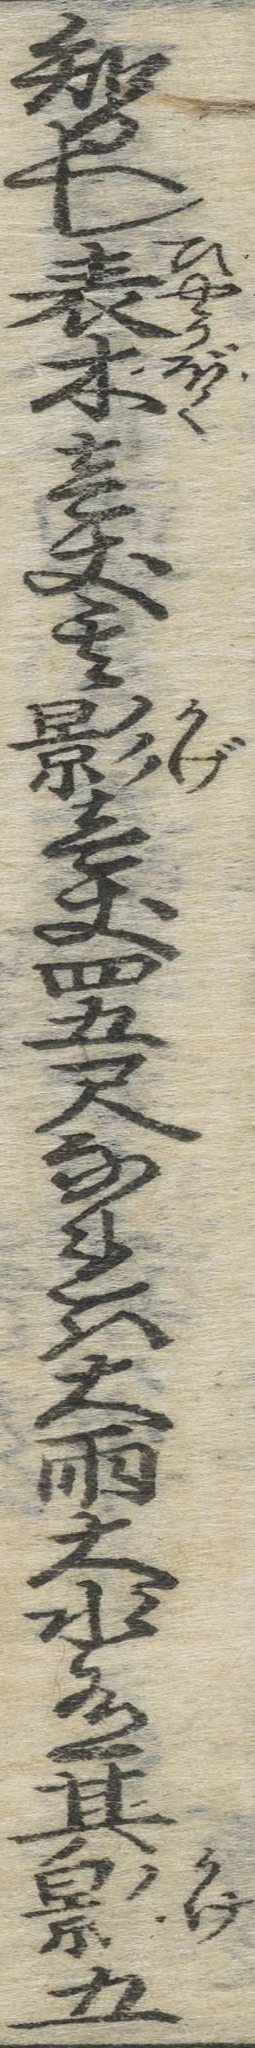知るへし表木壱丈其影壱丈四五尺なれは大雨大水有其影五
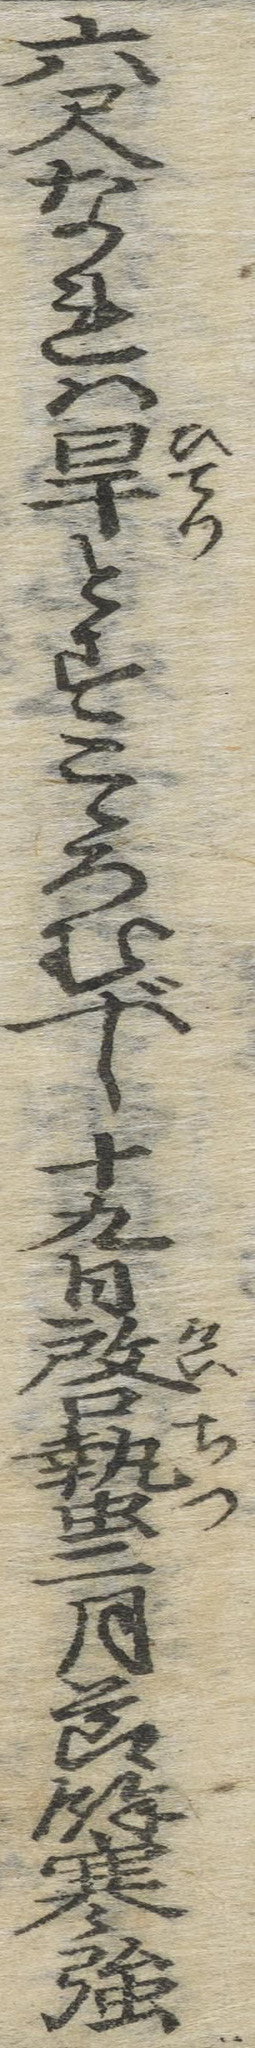六尺なれは旱とすこゝろむべし十九日啓蟄二月節余寒強
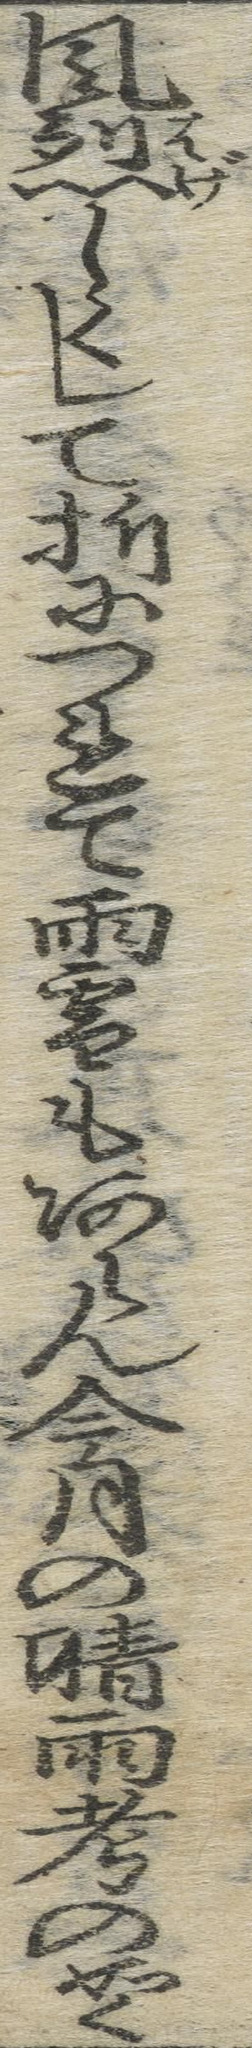風烈しくして折につれて雨雪もあらん今月の晴雨考の如く
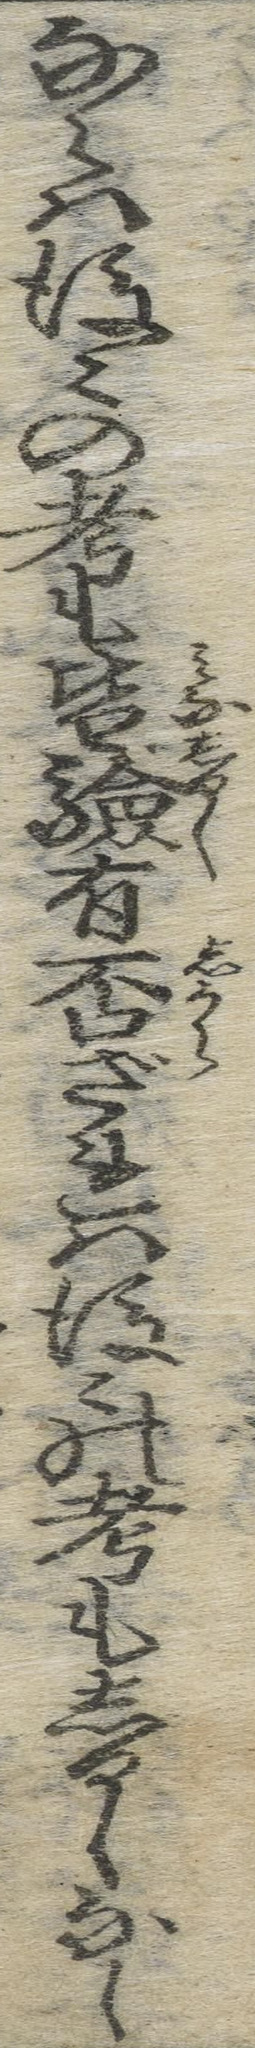ならは後〻の考も皆験有否ざれは後〻の考もしるしなし
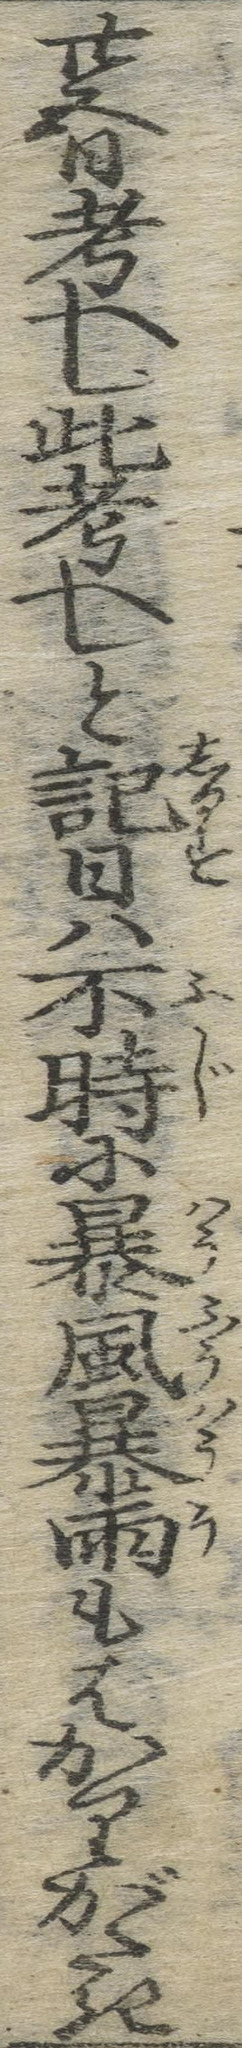廿五日考へし此考へしと記日は不時に暴風暴雨もはかりがたき

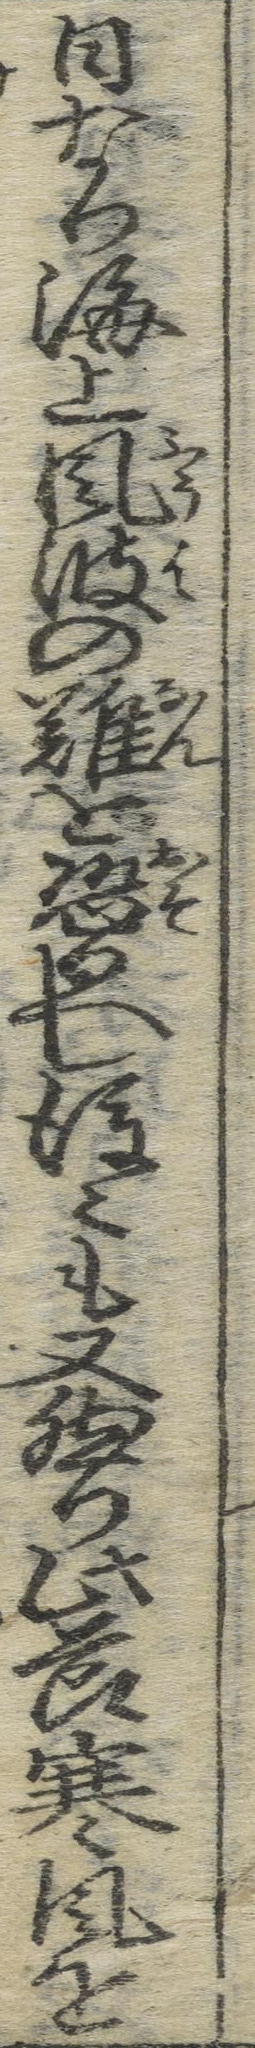月なり海上風波の難を恐るへし後〻も又然り此前寒風を
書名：[晴雨考]
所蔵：東京大学地震研究所図書室 Earthquake Research Institute Library, The University of Tokyo, JAPAN
